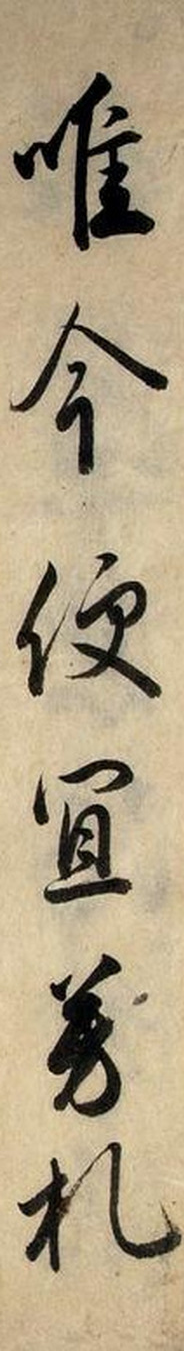唯今便宜芳札
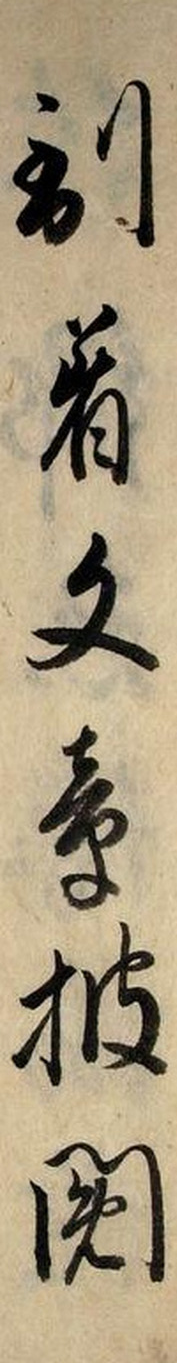到着文章披閲
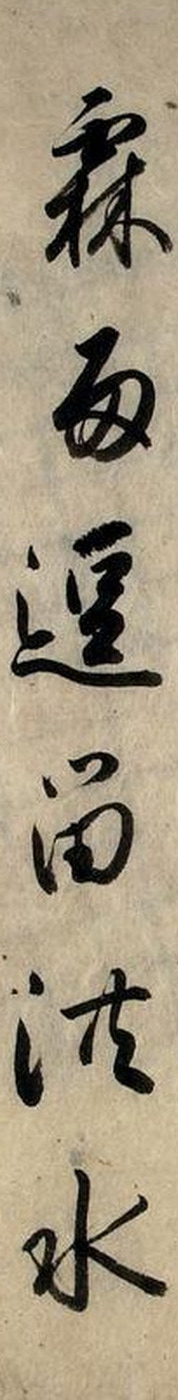霖雨逗留洪水
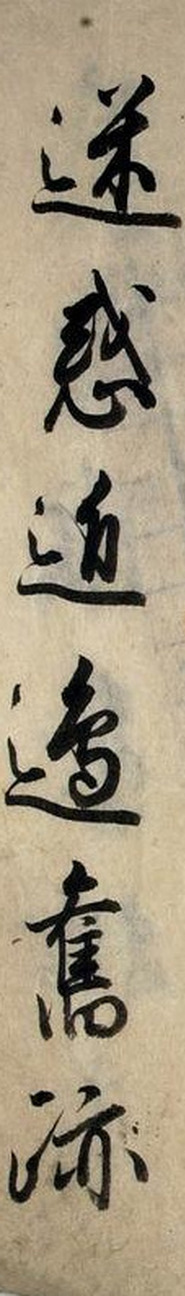迷惑近辺旧跡

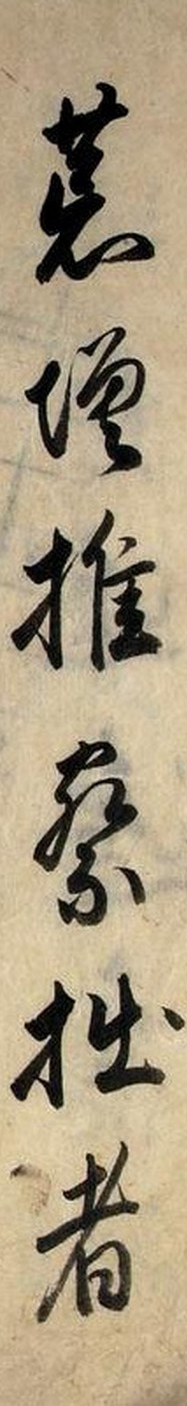荒増推察拙者
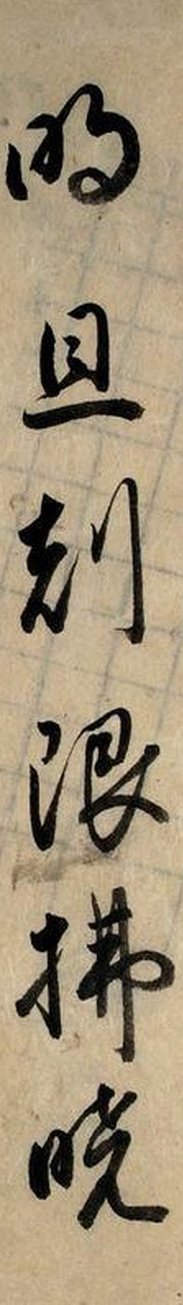明旦刻限払暁
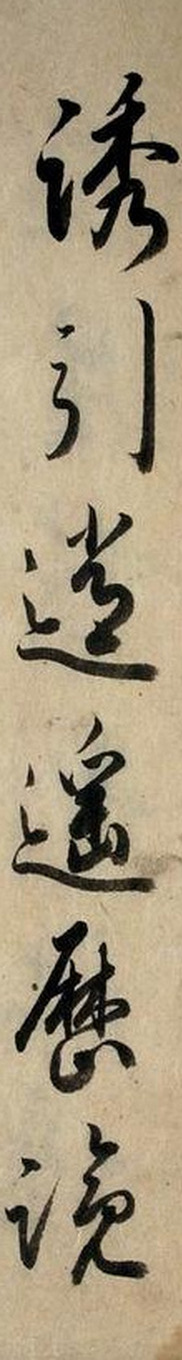誘引逍遥歴覧
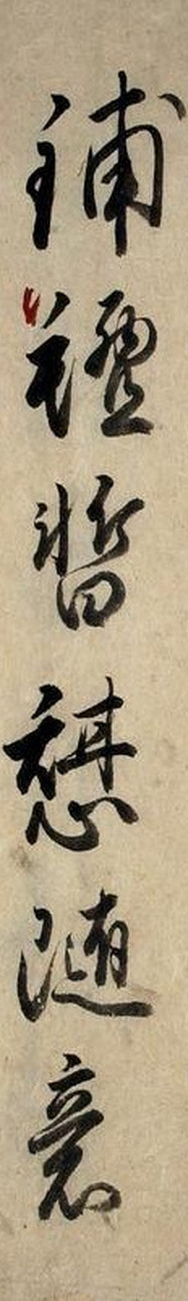鋪氈暫憩随意

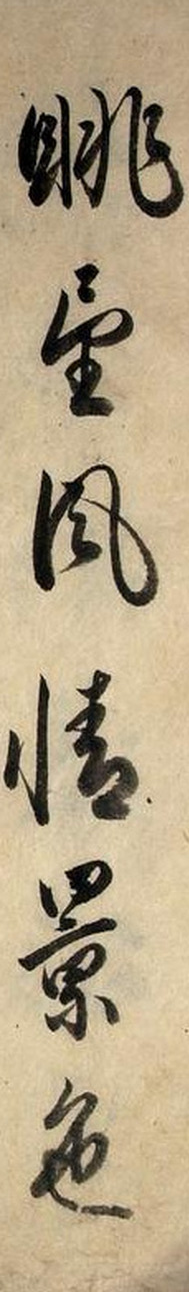眺望風情景色
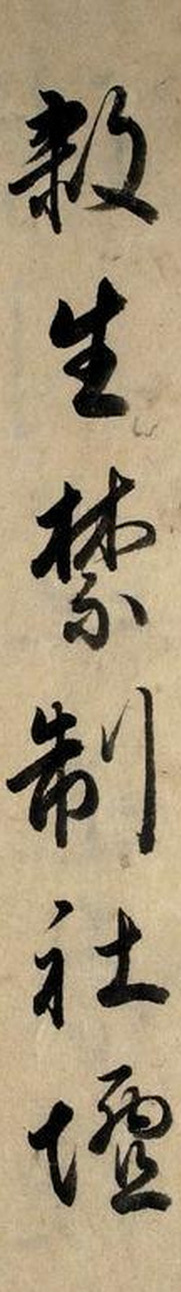殺生禁制社壇
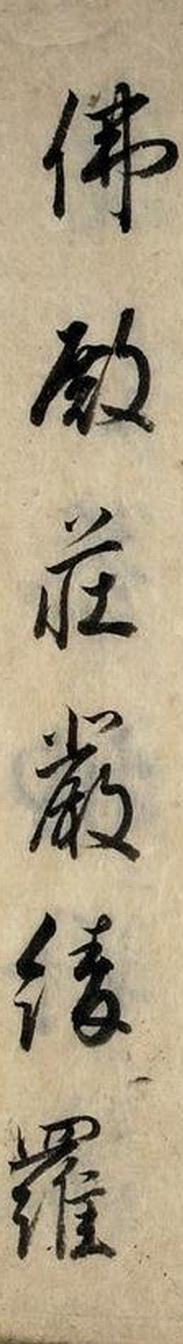仏殿荘厳綾羅
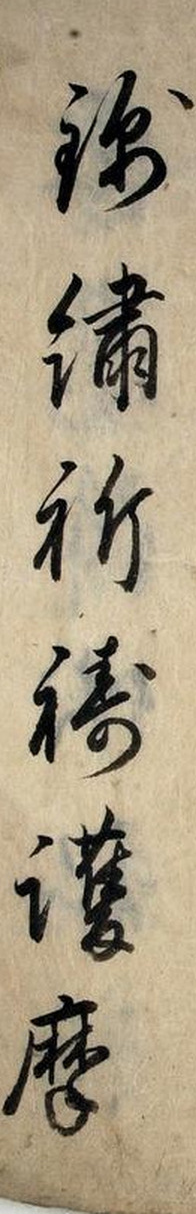錦繍祈祷護摩

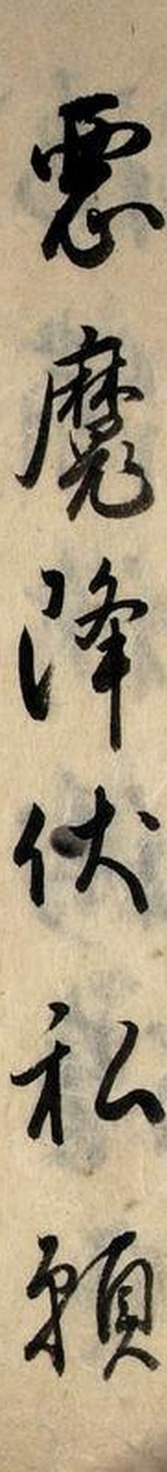悪魔降伏私願
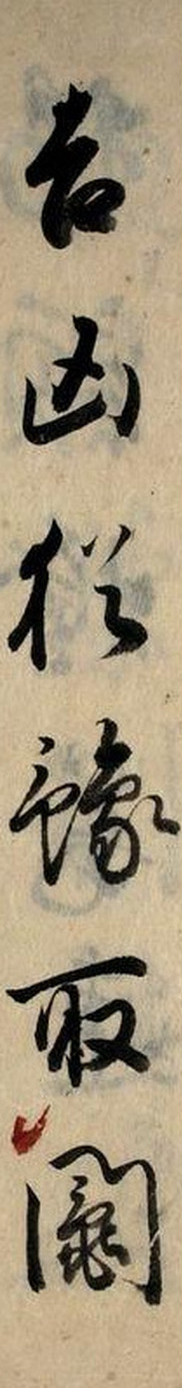吉凶猶予取䦰
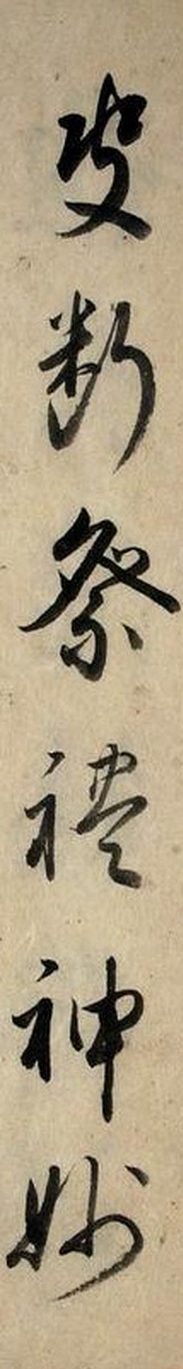決断祭礼神妙
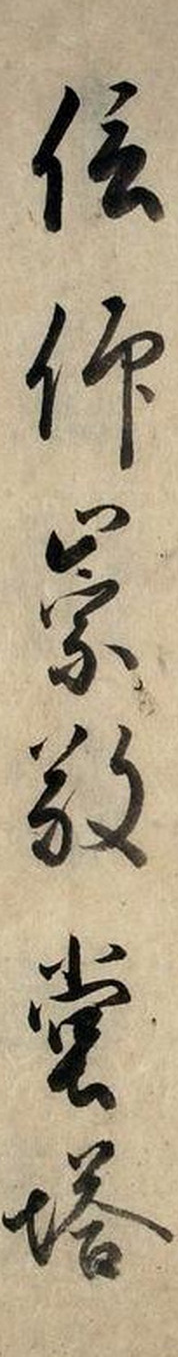信仰崇敬堂塔
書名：世話千字文（手習手本）
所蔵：福井県文書館 Fukui Prefectural Archives
